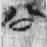公
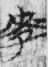李
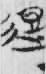逗
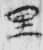里
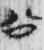公
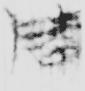○（隋）
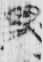○（得）
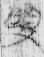受
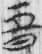○（期）
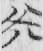癸
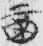梄（酉）
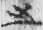之
